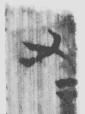又=
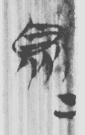眾=
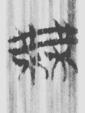無
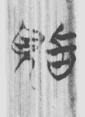{見旨}
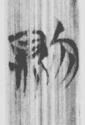則
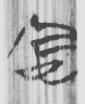{宀𠁩}
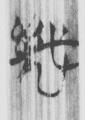幾
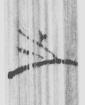之
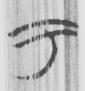于
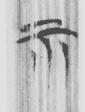示
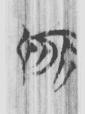所
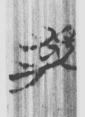爭
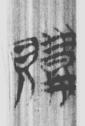{貝巤}
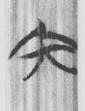內
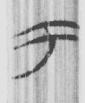于
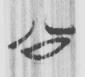公
